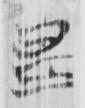是
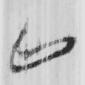㠯（以）
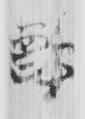{言千心}
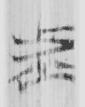者
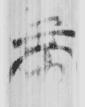不
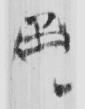甬
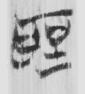聖
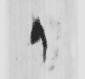人
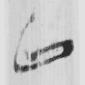㠯（以）
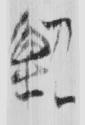解
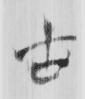古
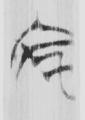{宀厇}
